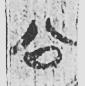公
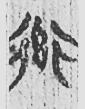率
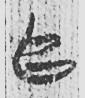𠂤
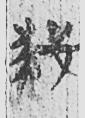{求戈}
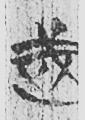武
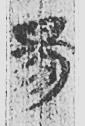昜
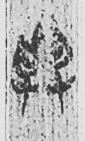與
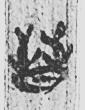晉
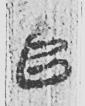𠂤
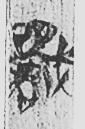戰
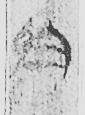於
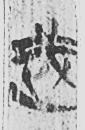武
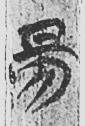昜
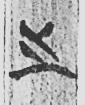之
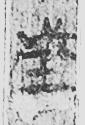城
